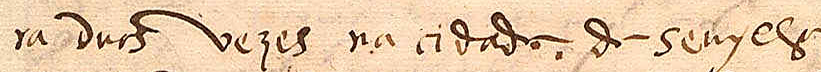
ra duas vezes na cidade de seuylha
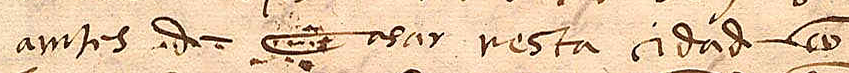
amtes de Casar nesta cidade cō
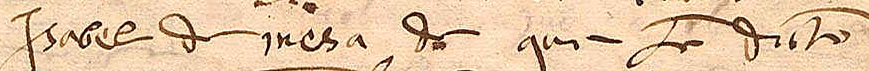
Jsabel de mesa de que tē dīcto
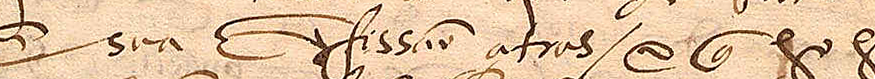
ē sua cōfissão atras / e q̄ ho ha
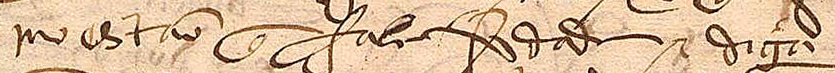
moestão q̄ fale ꝟdade e diga
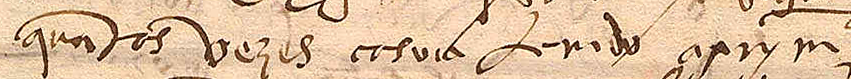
quātas vezes casou temdo / a prymra
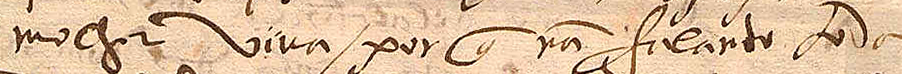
molher viua / porq̄ nā falando toda
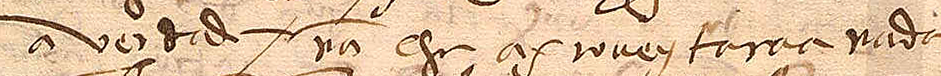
a verdade / nā lhe aproueytaraa nada
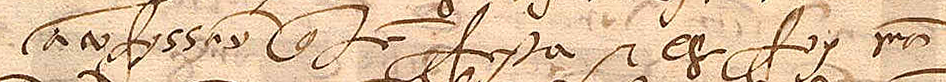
a cōfissão q̄ tē feyta e lhe foy mā
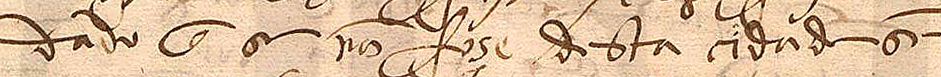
dado q̄ se nā fose desta cidade sē
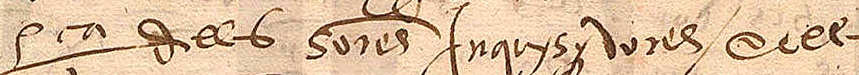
Lça delles s̄ores Jnquysydores / e elle
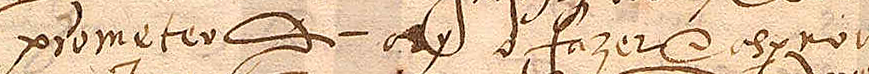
prometeo de asy o fazer e asynou
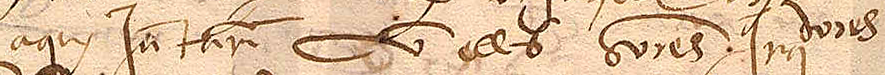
aquy Jūtamte Cō elles s̄ores Jnqdores
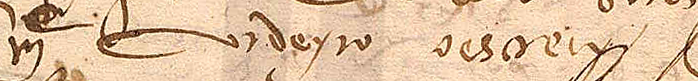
mel Cordeyro o escreuy
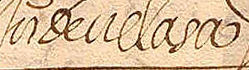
Jū de uelasco
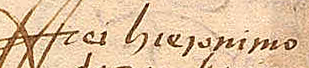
Frei hieronimo
